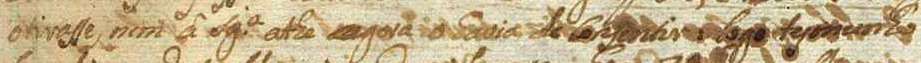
o tirasse, nem á Ig.a athe agora o havia de Consentir logo tesmunho
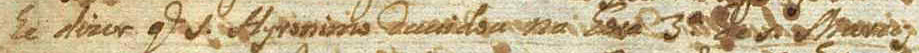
he dizer q̄ s. Hyronimo duuidou na hora 3.a de s. Marcos
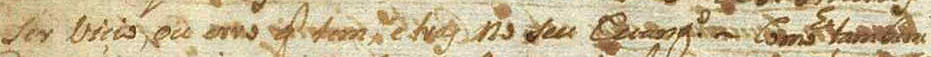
ser vicio, ou erro q̄ tem, e tras no seu Euang.o = Como he tambem
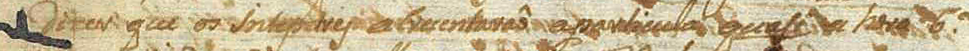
dizer que os Intepetres aCresentaraõ a particula quase a hora 6.a
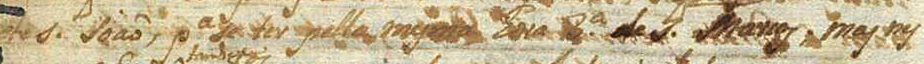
de s. Ioaõ, p.a se ter pella mesma hora 3.a de s. Marcos, mas nes
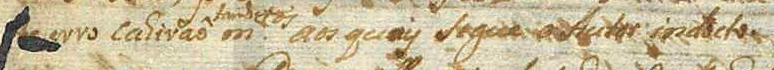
erro cahiraõ m.tos aos quais segue o Autor indocto.
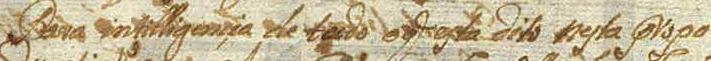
Para intilligencia de tudo o q̄ esta dito nesta propo
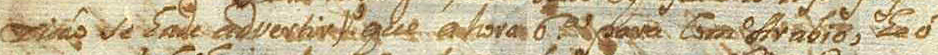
zisaõ se ha de advertir que a hora 6.a para com Arabio, he ó
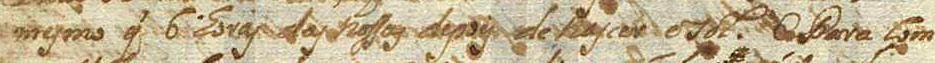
mesmo q̄ 6 horas das nossas depois de nascer o sol. E Para com
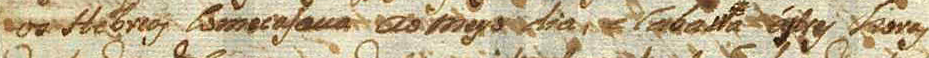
os Hebreos começasaua ao meyo dia, e Cabaua ás tres horas
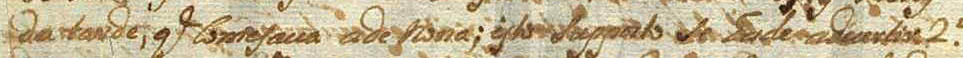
da tarde, q̄ Comesaua a de nona; isto supposto se ha de adeuertir 2.o
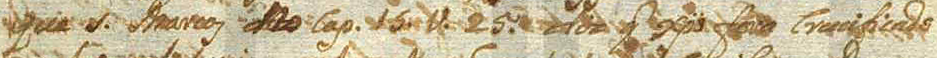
que s. Marcos do Cap. 15. V. 25 dos q̄ xpō fora Crucificado
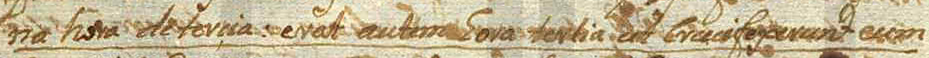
na hora de tercia. erat autem hora tertia et Crucifexerunt eum
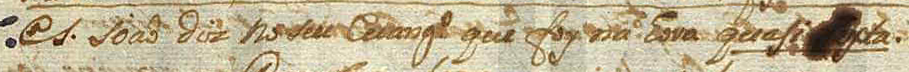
E s. Ioaõ diz no seu Euang.o que foy na hora quasi __xta.
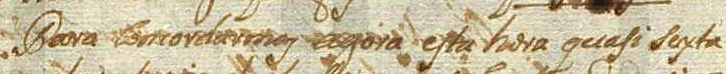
Para concordarmos agora esta hora quasi sexta
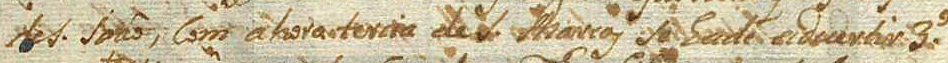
de s. Ioaõ, Com a hora tercia de S. Marcos só ha de adeuertir 3.o
